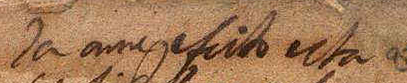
la a me efeito esta
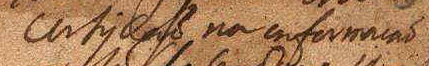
certydaõ na enformaçaõ
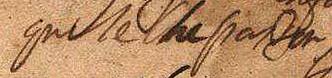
que se lhe passou
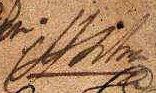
M Silua
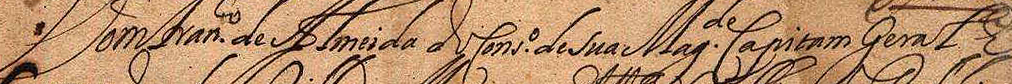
Dom Fran.co de Almeida do Cons.o de sua Mag.de Capitam Geral E
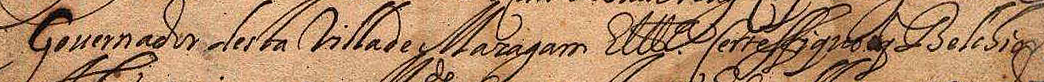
Gouernador desta Villa de Mazagam Et̄tta Certefiquo q̄ Belchior
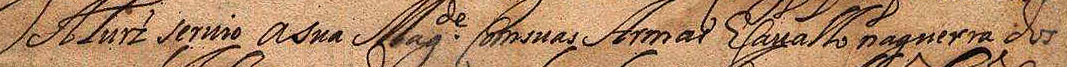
Alurz̄ seruio a sua Mag.de Com suas Armas E Cauallo na guerra dos
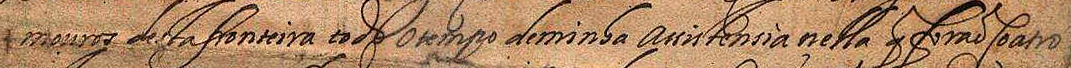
mouros desta fronteira todo o tempo de minha asistensia nella q̄ foraõ Coatro
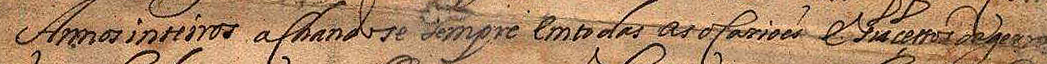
Annos inteiros aChandose sempre em todas as oCazioẽs e sucessos de gerra
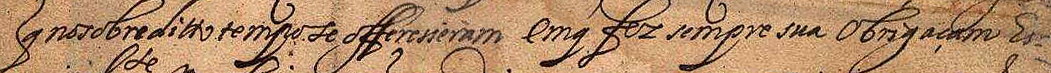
q̄ no sobreditto tempo se offeresseram em q̄ fez sempre sua obrigaçam Es
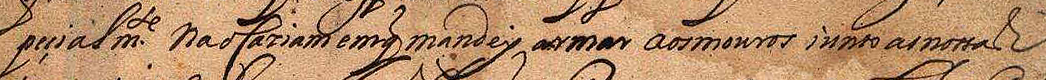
pecialm.te na oCaziam em q̄ mandey armar aos mouros iunto as nossas
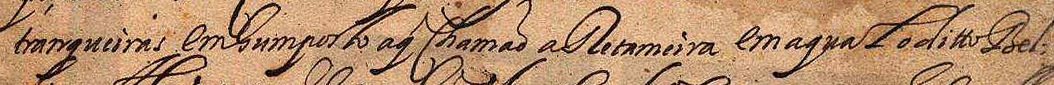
tranqueiras em hum posto a q̄ Chamaõ a Retameira em a qual o ditto Bel
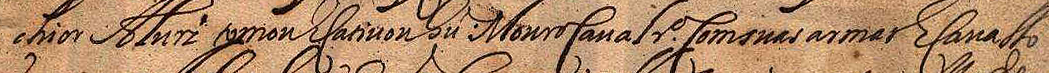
chior Alurz̄ tornou E Catiuou hū Mouro Caualro. Com suas armas E Cauallo
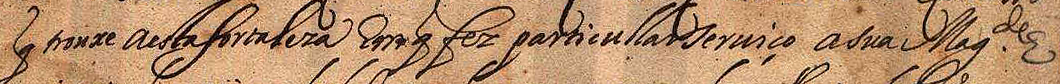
q̄ trouxe a esta fortaleza Em q̄ fez particullar seruiço a sua Mag.de E
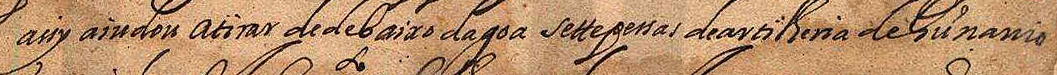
assy aiudou a tirar de debaixo dagoa sette pessas de artilheria de hū nauio
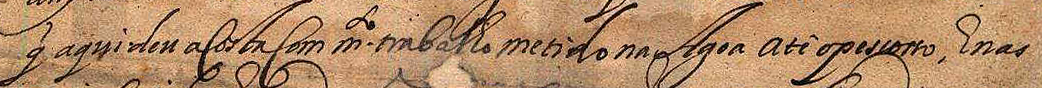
q̄ aqui deu a Costa Com m.to trabalho metido na Agoa até o pescosso, E nas
